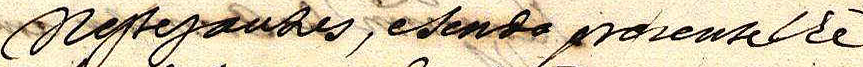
nestes autos, e sendo prezente lhe
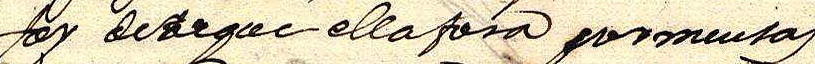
foy dito que ella presa por muitas
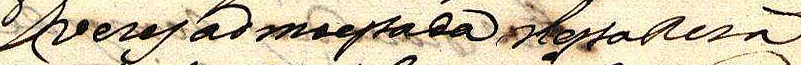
vezes admoestada nesta Meza
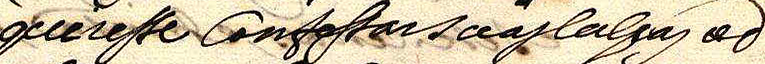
quizesse Confessar suas Culpas o q̄
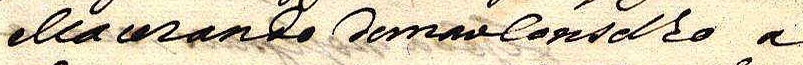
ella uzando de mao conselho a
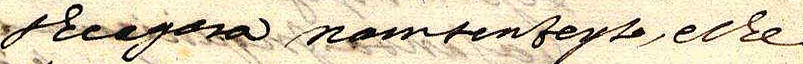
the agora nam tem feyto, e lhe
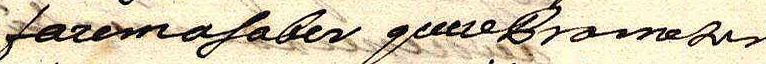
fazem a saber que o Promotor
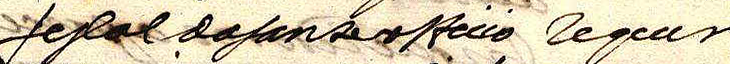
fisCal do santo officio Requer
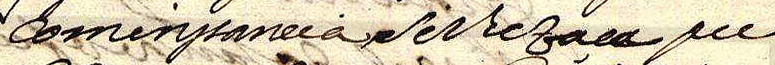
com instancia, se lhe faça pu
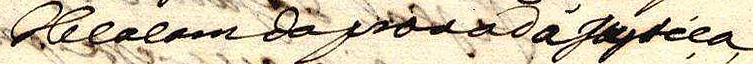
blicacam da prova da Justiça,
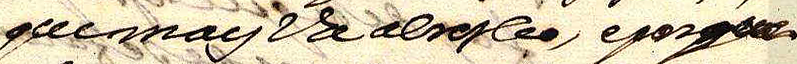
que maes lhe aCresCeo, e porque
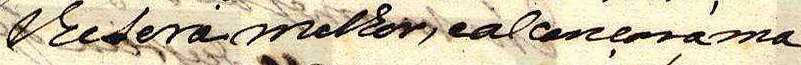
lhe sera melhor, e alcançará ma
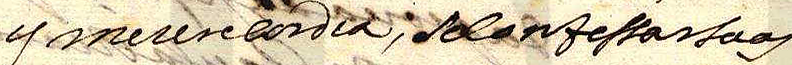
is mezerecordia, se confessar suas
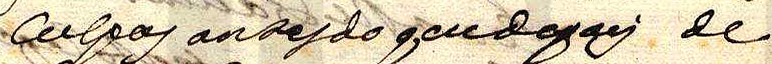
Culpas antes do que depois de
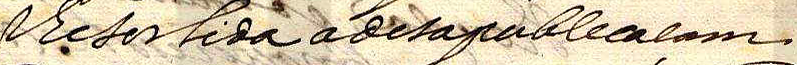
lhe ser Lida a dita publicaçam
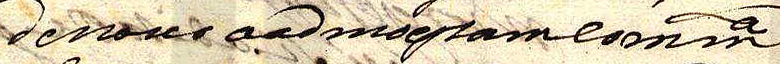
de nouo a admoestam com mta
